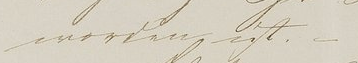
worden ist. –
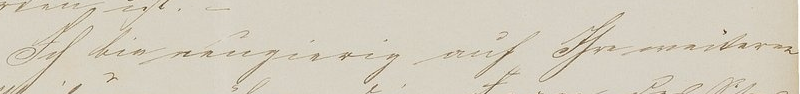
Ich bin neugierig auf Ihre weiteren
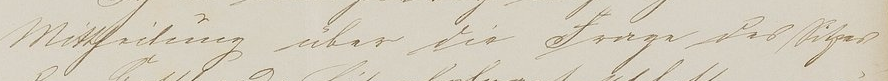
Mittheilung über die Frage des Sitzes
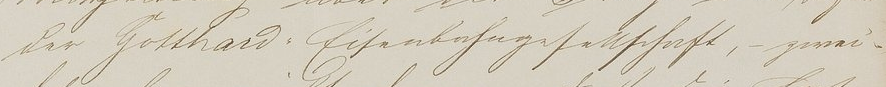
der Gotthard-Eisenbahngesellschaft, – zwei-
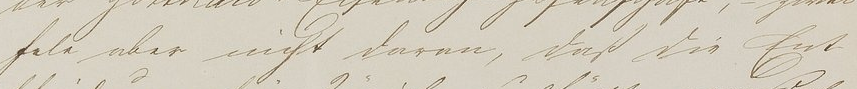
fele aber nicht daran, daß die Ent-
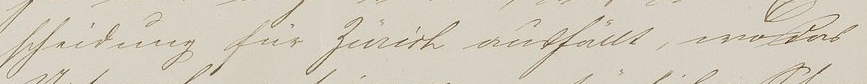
scheidung für Zürich ausfällt, wo das
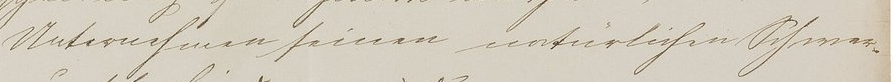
Unternehmen seinen natürlichen Schwer-
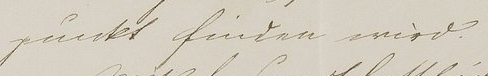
punkt finden wird.
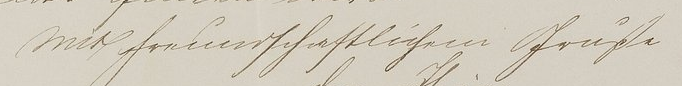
Mit freundschaftlichem Gruße
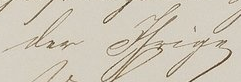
der Ihrige
